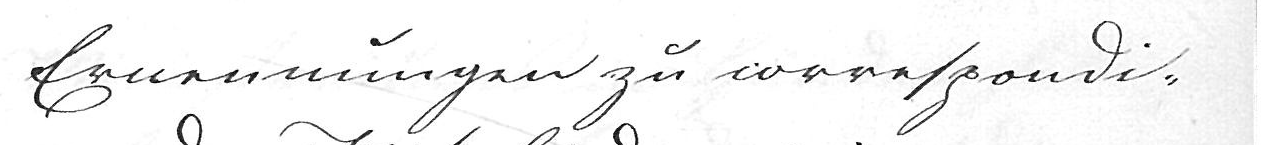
Ernennungen zu correspondi
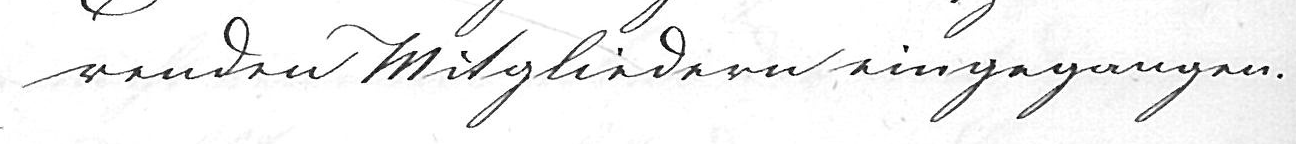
renden Mitgliedern eingegangen.
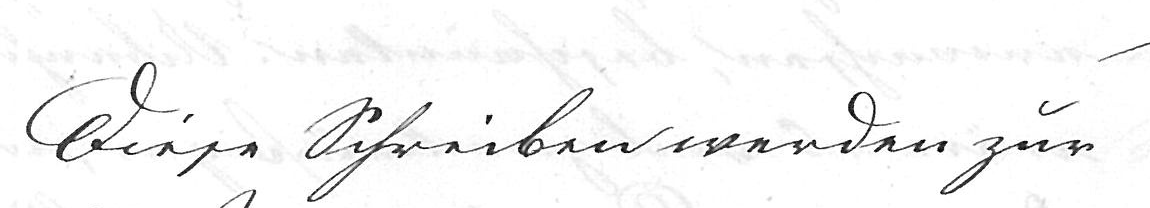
Diese Schreiben werden zur
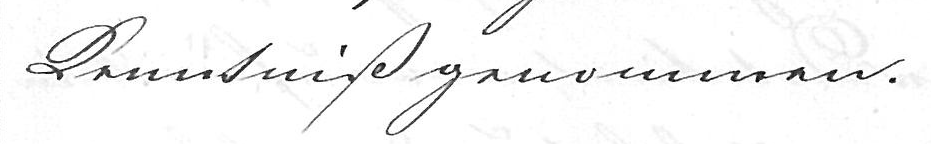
Kenntniß genommen.
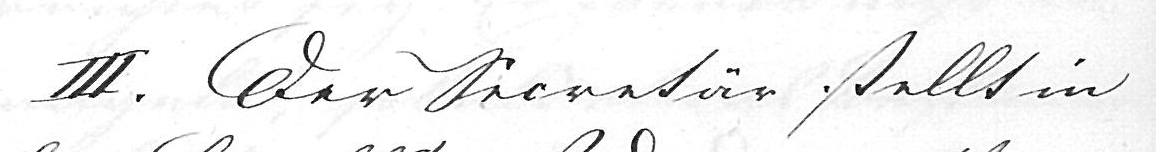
III. Der Secretär stellt in
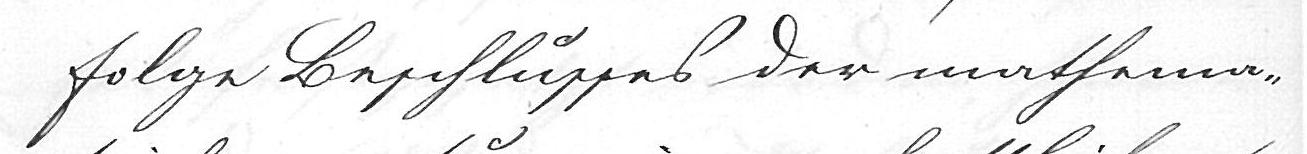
Folge Beschlusses der mathema-
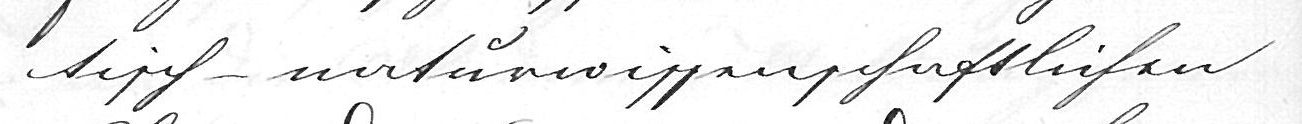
tisch-naturwissenschaftlichen
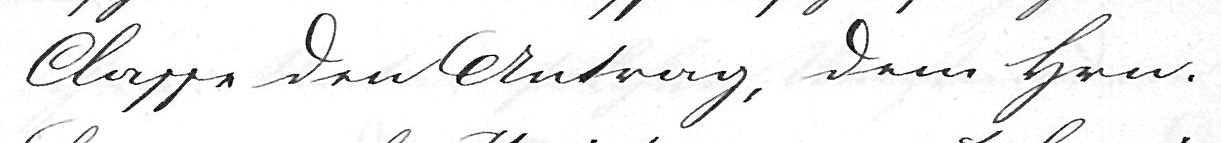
Classe den Antrag, dem Hrn.
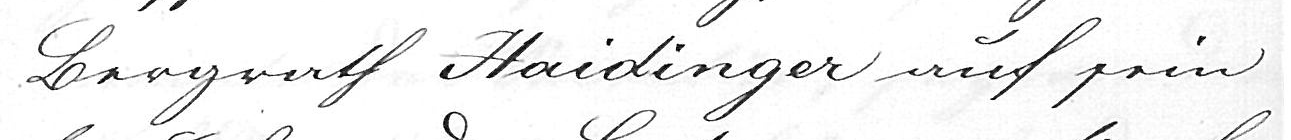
Bergrath Haidinger auf sein
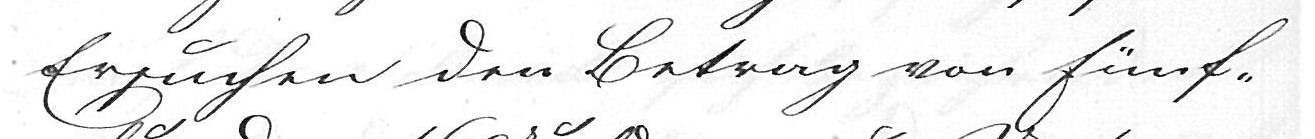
Ersuchen den Betrag von fünf-
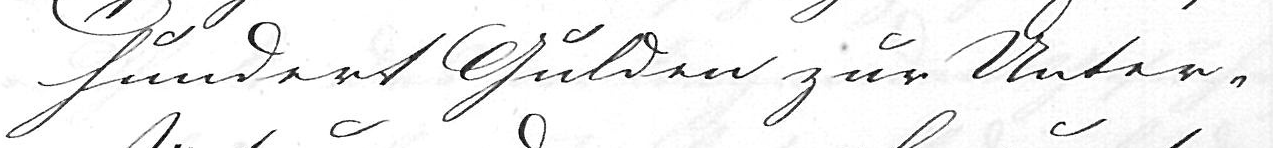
hundert Gulden zur Unter-
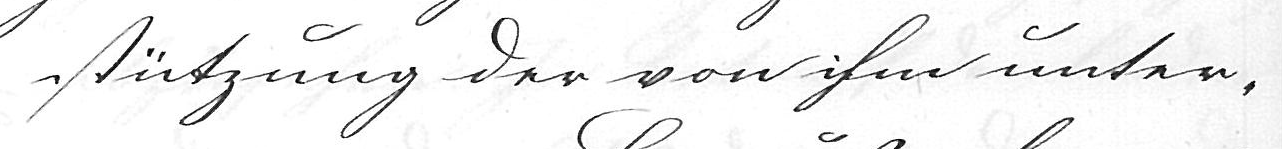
stützung der von ihm unter-
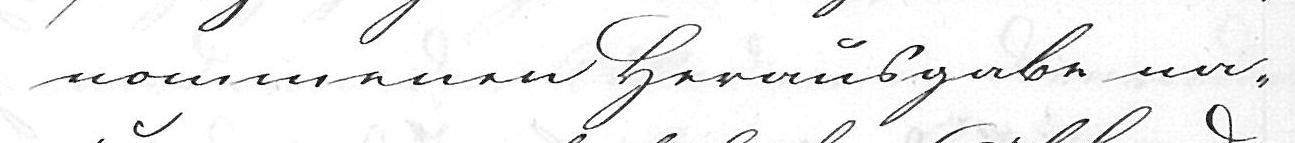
nommenen Herausgabe na-
